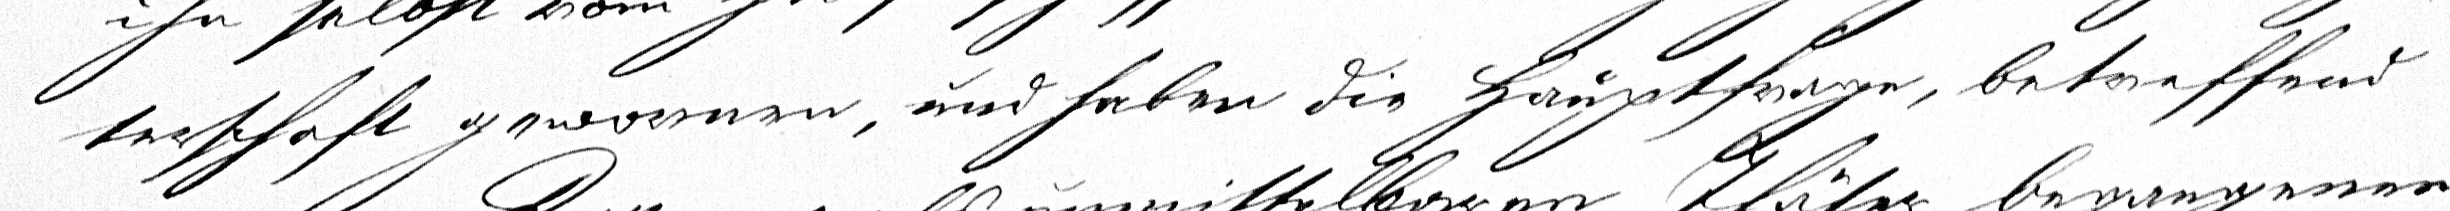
terschaft gewonnen, und haben die Hauptfrage, betreffend
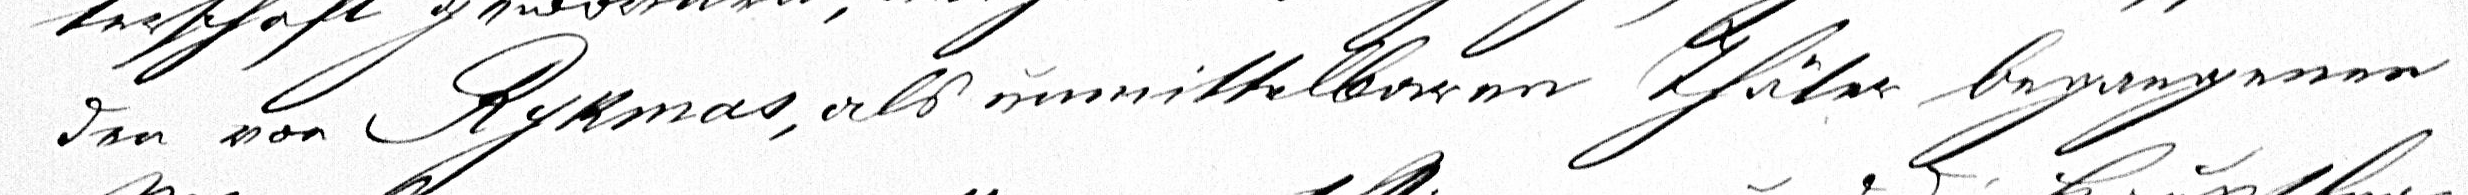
der von Rykmas, als unmittelbaren Thäler begangenen
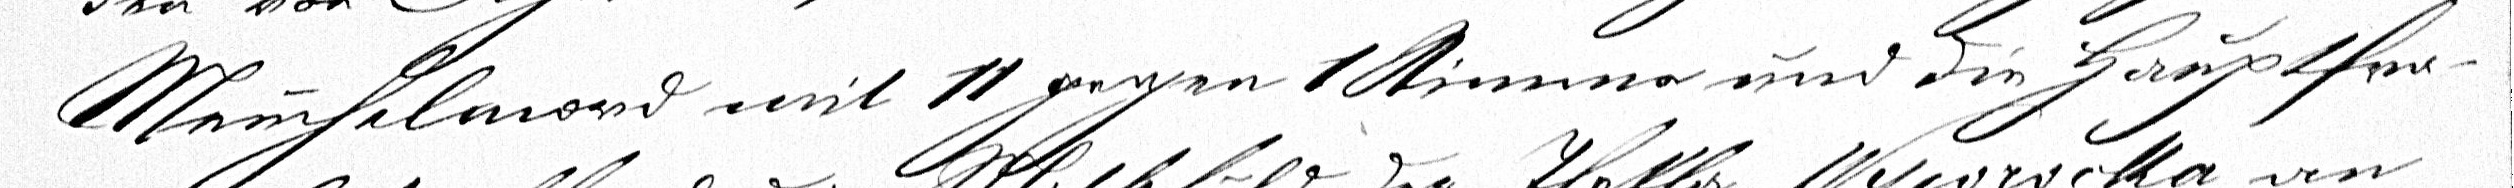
Meuchelmord mit 11 gegen 1 Stimme und die Hauptfra¬
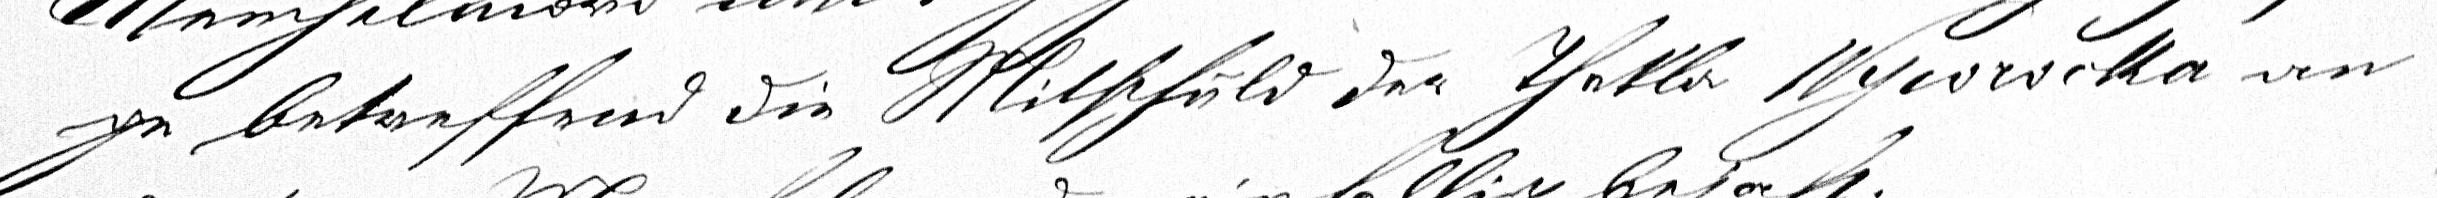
ge betreffend die Mitschuld der Thekla Wywrocka an
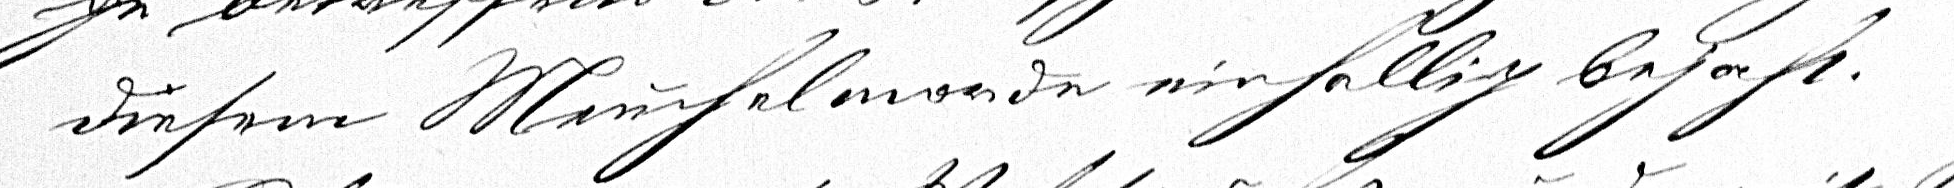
diesem Meuchelmorde einhellig bejaht.
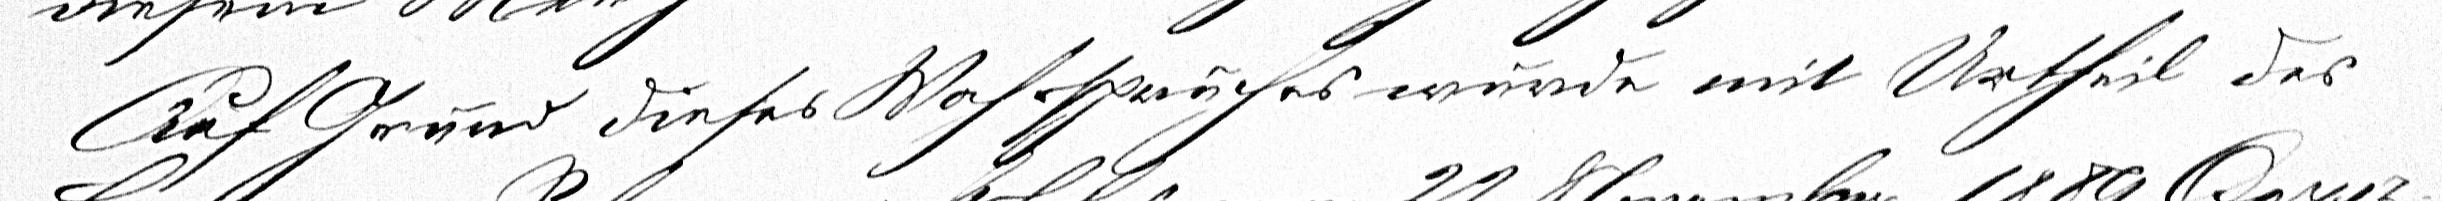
Auf Grund dieses Wahrspruches wurde mit Urtheil des
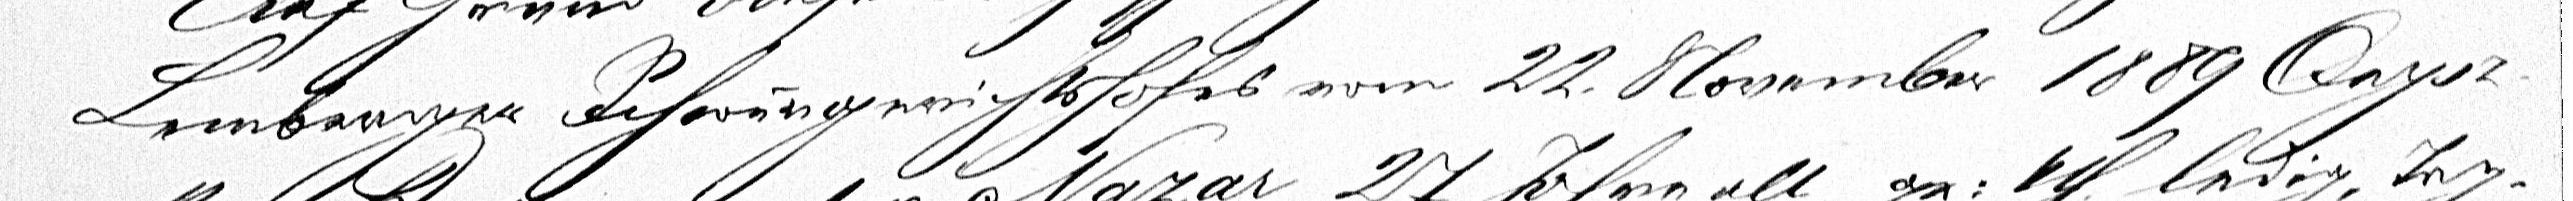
Lemberger Schwurgerichtshofes vom 22. November 1889 Onysz¬
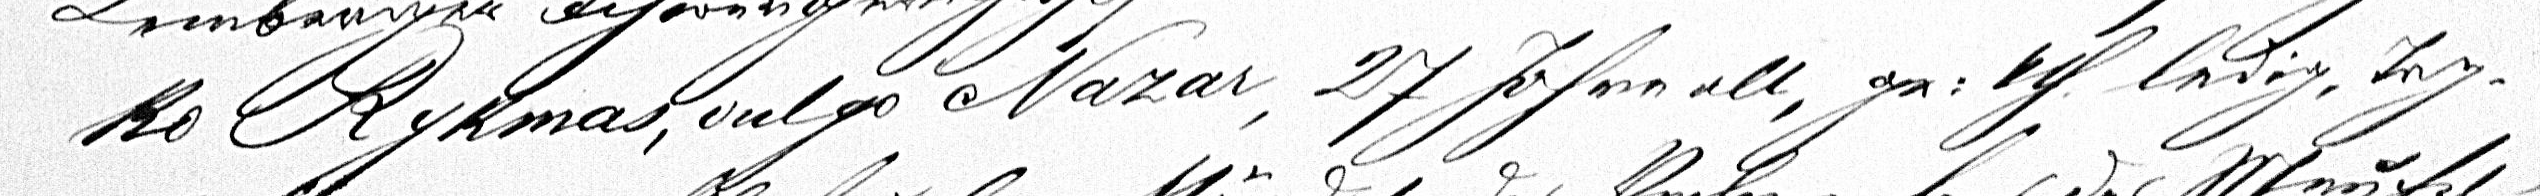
ko Rykmas, vulgo Nazar, 27 Jahre alt, ge: kth. ledig, Tag¬
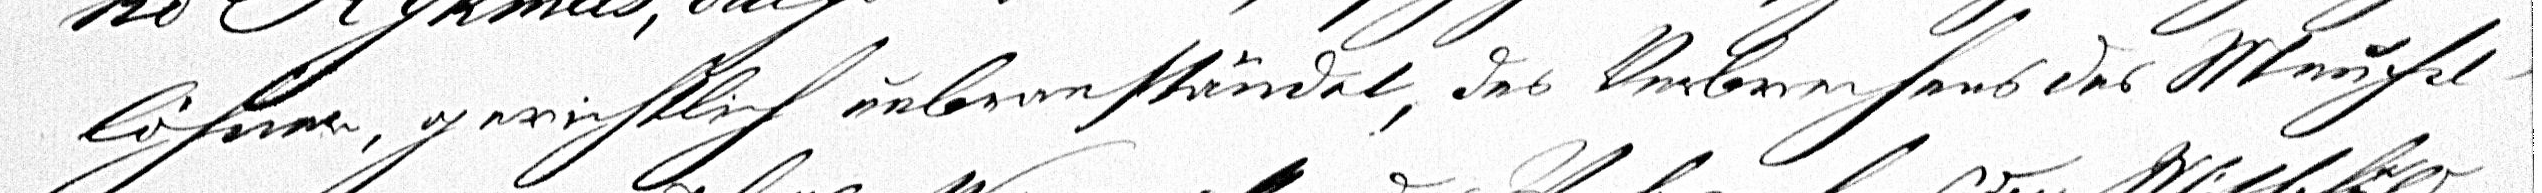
löhner, gerichtlich unbeanständet, des Verbrechens des Meuchel¬
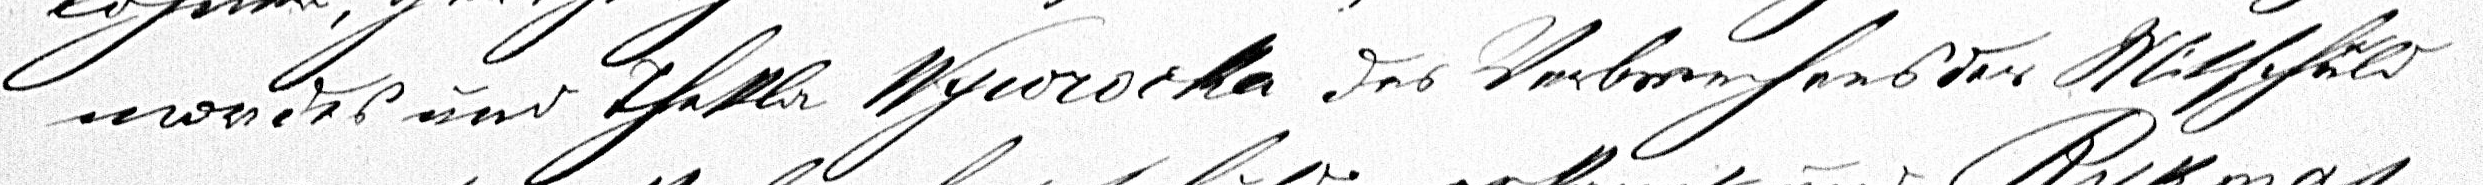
mordes und Thekla Wywrocka des Verbrechens der Mitschuld
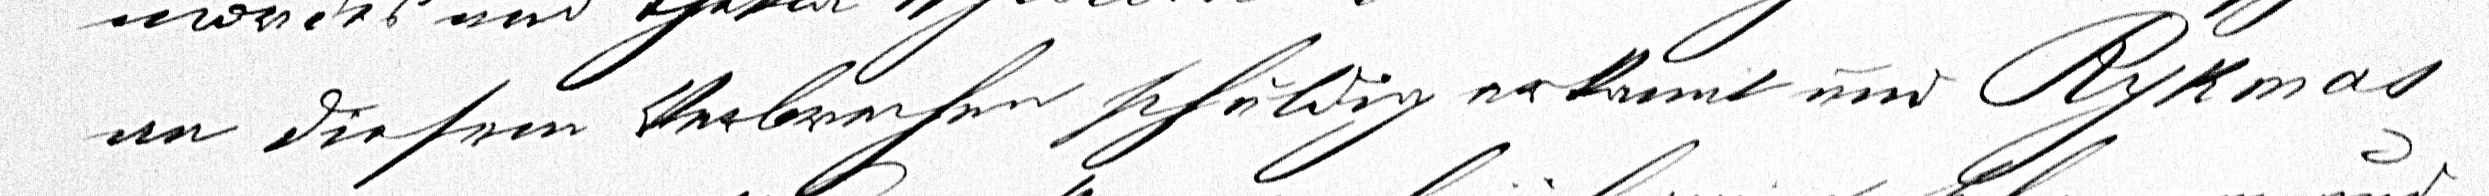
an diesem Verbrechen schuldig erkannt und Rykmas
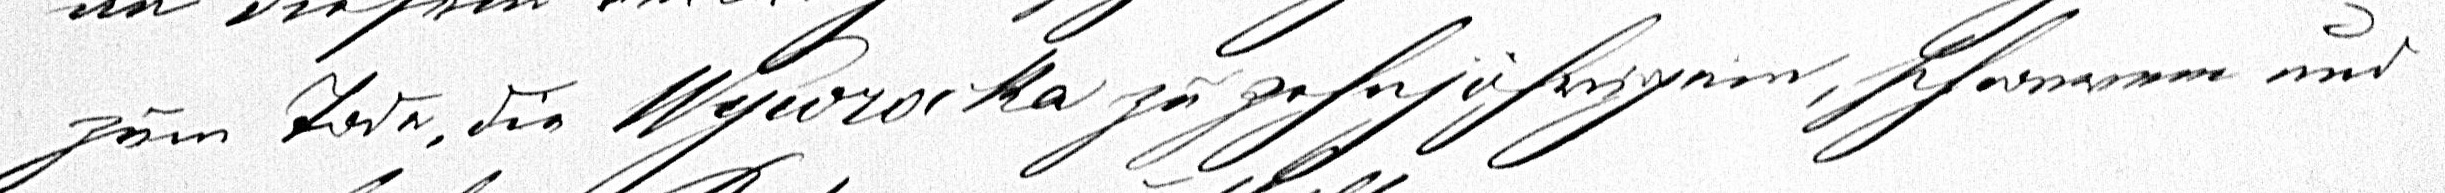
zum Tode, die Wywrocka zu zehnjährigem, schwerem und
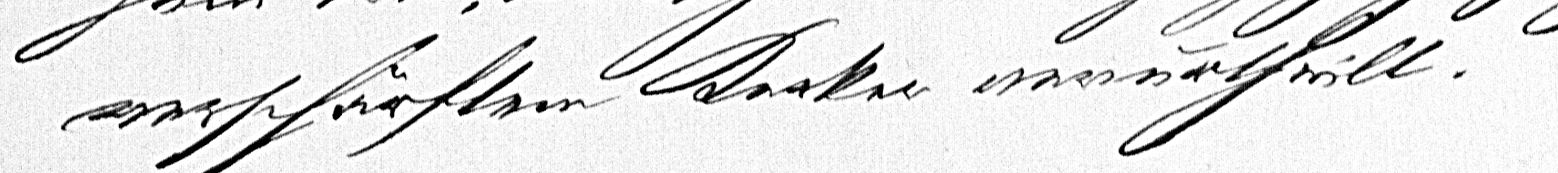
verschärftem Kerker verurtheilt.
